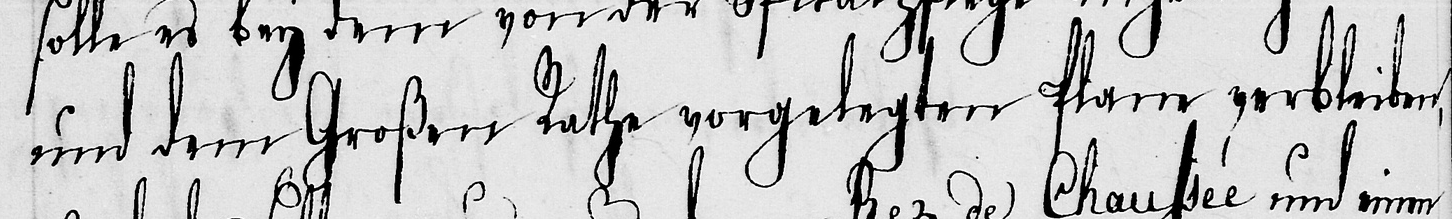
und dem Großen Rathe vorgelegten Plane verbleib¬
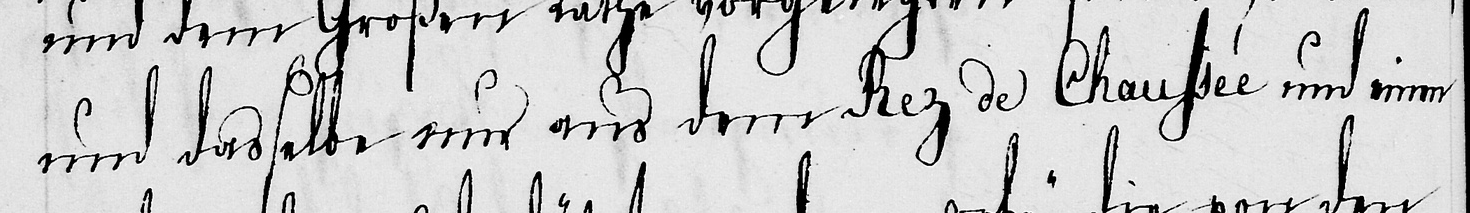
und dasselbe nur aus dem Rez de Chaussée und ein¬
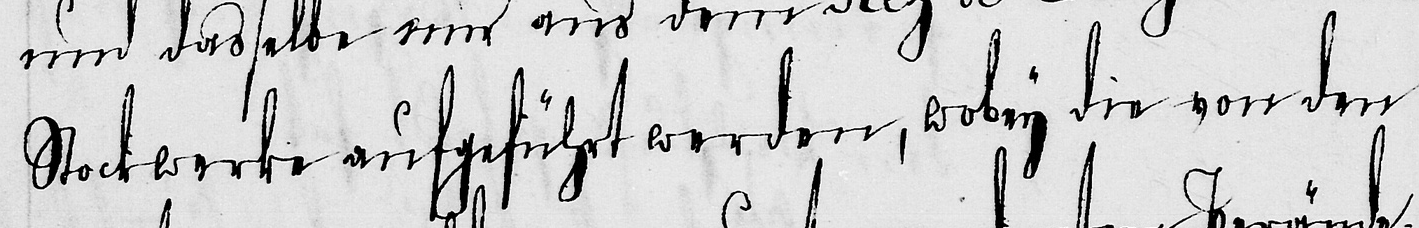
Stockwerke aufgeführt werden, wobey die von den
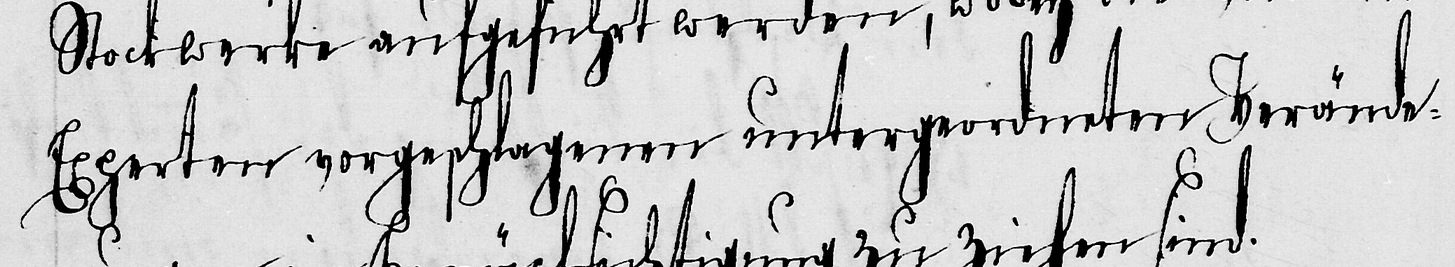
Experten vorgeschlagenen untergeordneten Verände¬
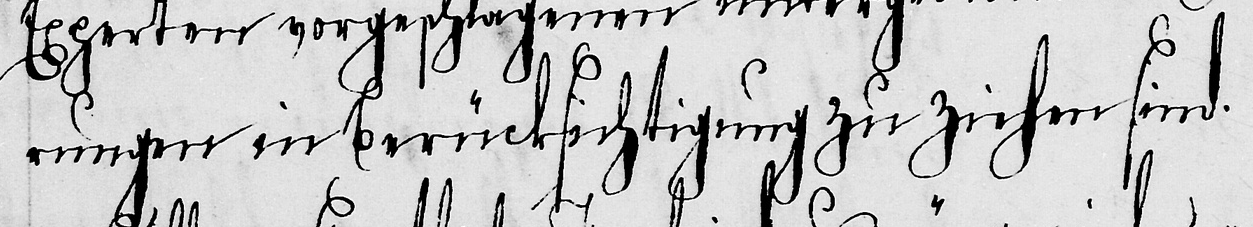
rungen in Berücksichtigung zu ziehen sind.
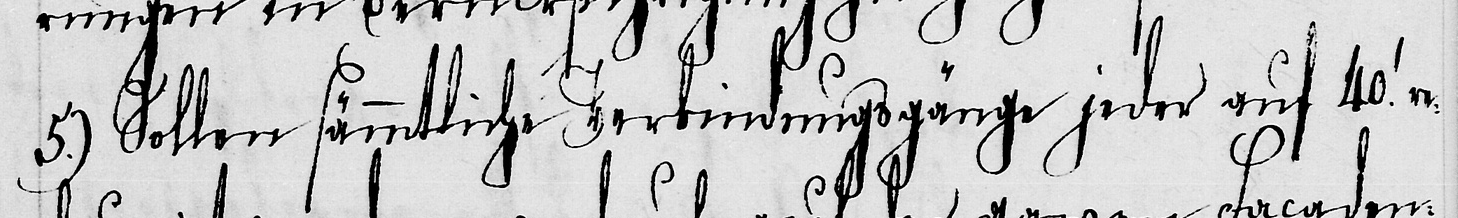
5.) Sollen sämmtliche Verbindungsgänge jeder auf 40.
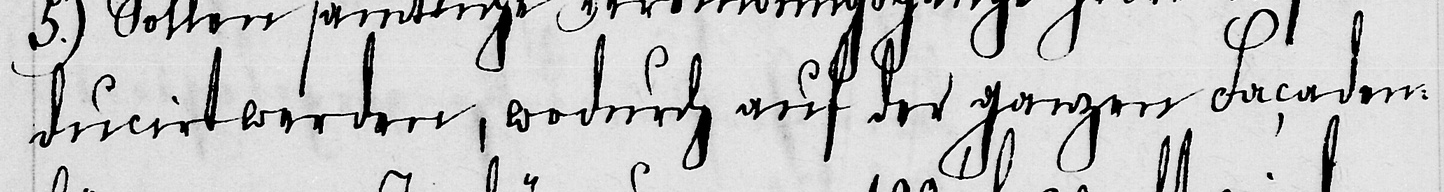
ducirt werden, wodurch auf der ganzen Facaden¬
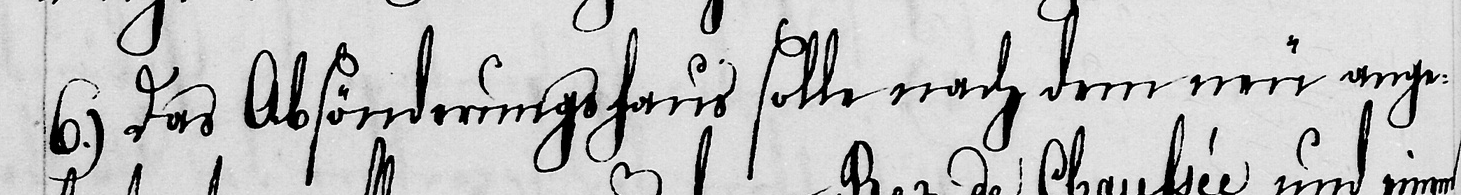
6.) Das Absönderungshaus solle nach dem neu ang¬
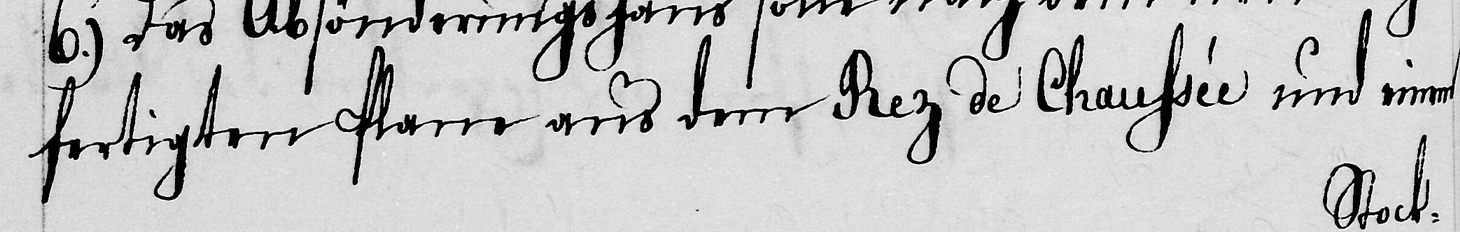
efertigten Plane aus dem Rez de Chaußée und ein¬
